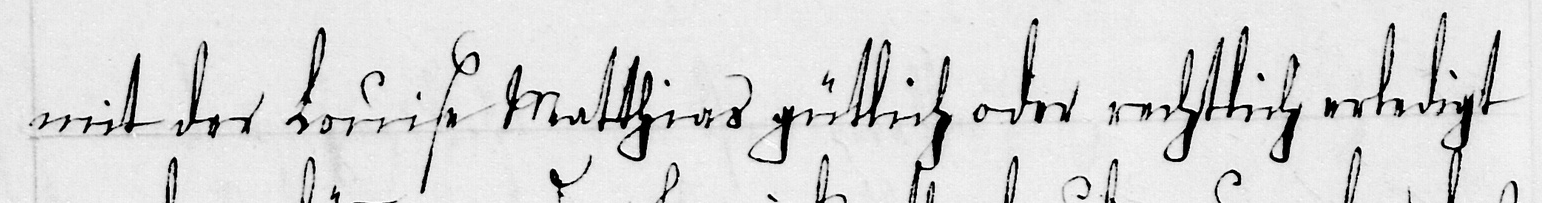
mit der Louise Matthias gütlich oder rechtlich erledigt
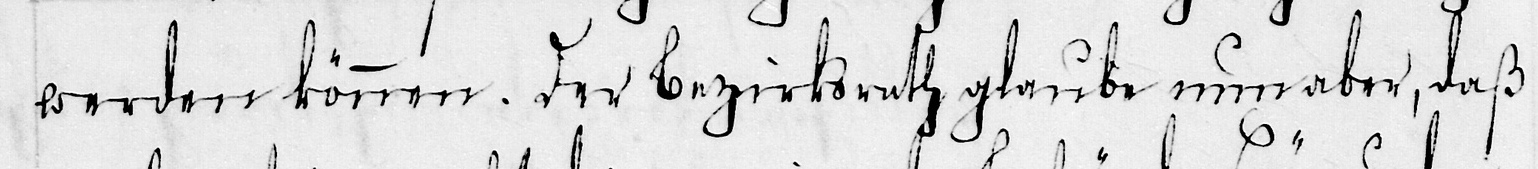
werden können. Der Bezirksrath glaube nun aber, daß
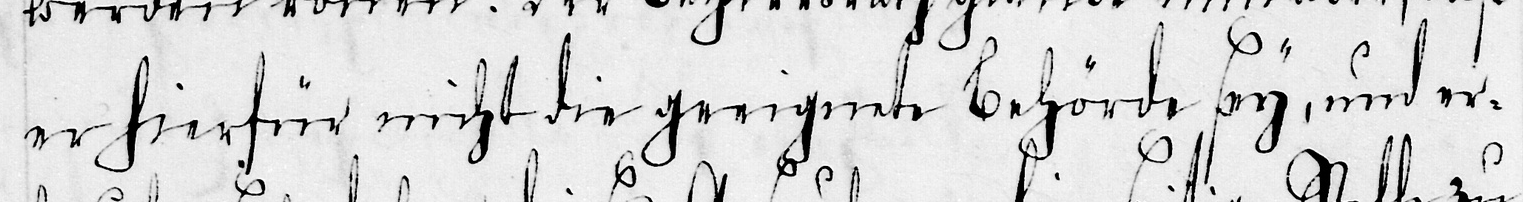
er hierfür nicht die geeignete Behörde sey, und er¬
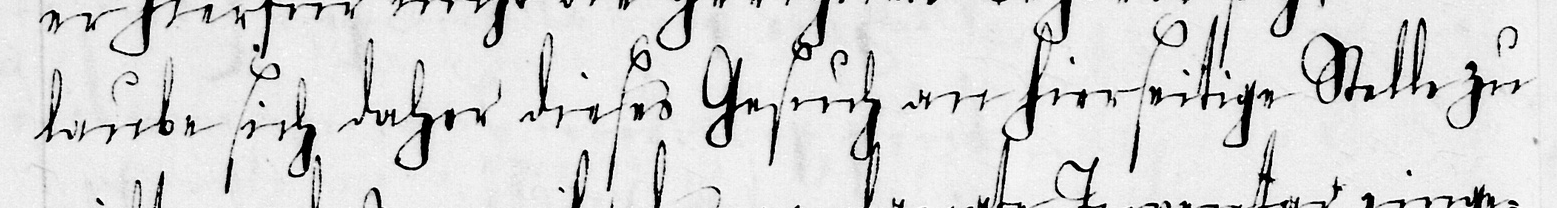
laube sich daher dieses Gesuch an hierseitige Stelle zu
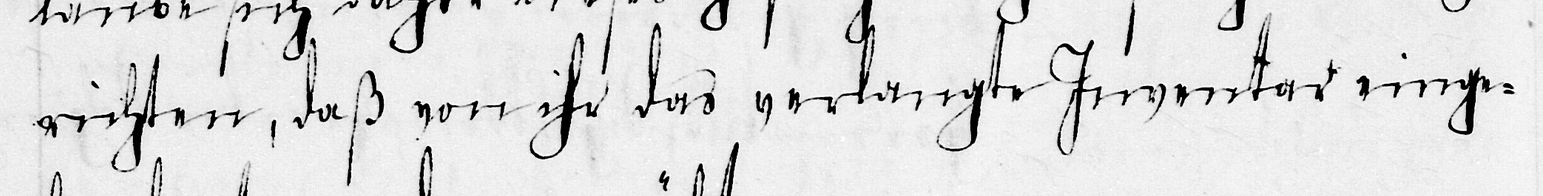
richten, daß von ihr das verlangte Inventar einge¬
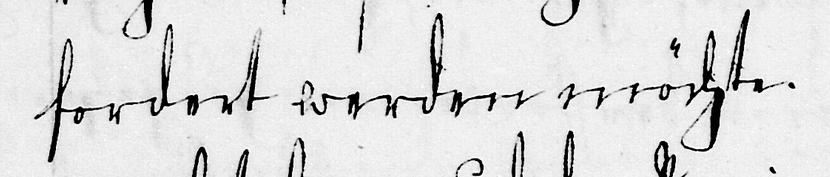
fordert werden möchte.
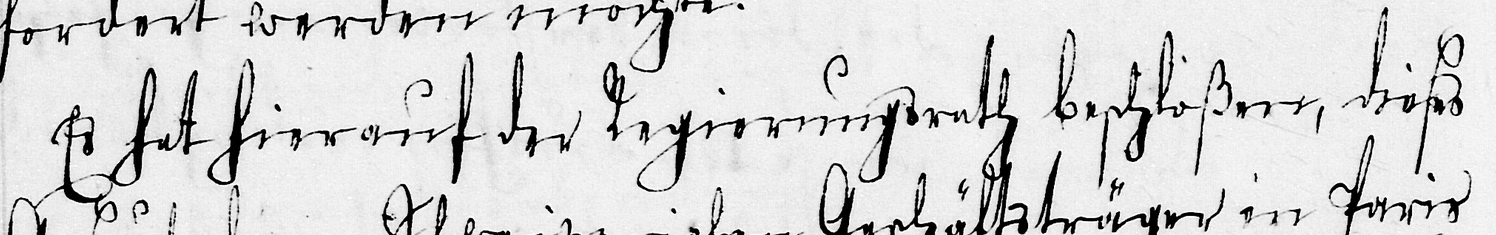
Es hat hierauf der Regierungsrath beschloßen, dieses
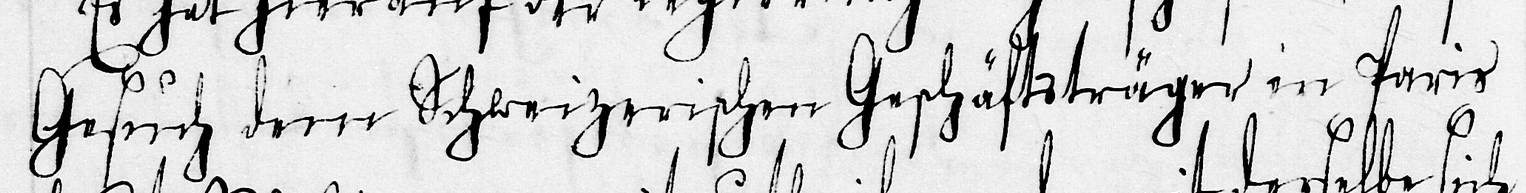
Gesuch dem Schweizerischen Geschäftsträger in Paris
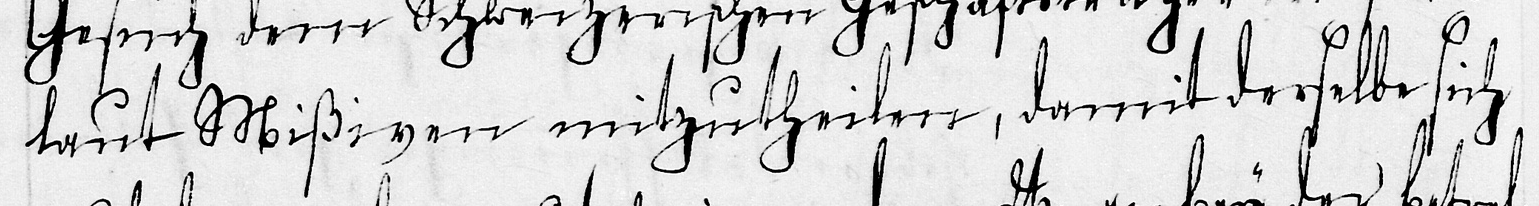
laut Mißiven mitzutheilen, damit derselbe sich
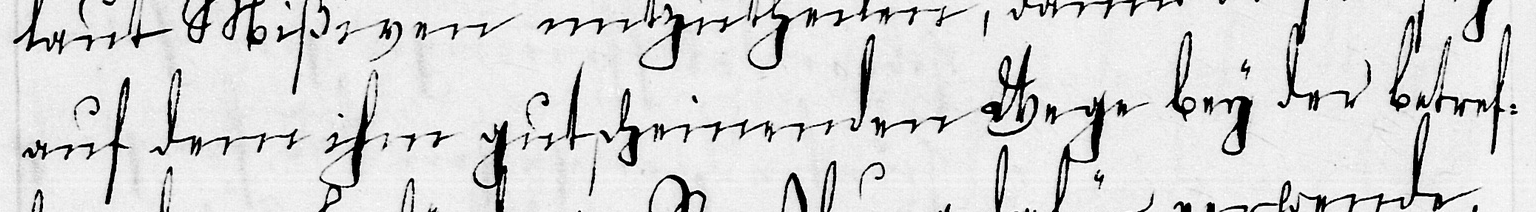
auf dem ihm gutscheinenden Wege bey der betref¬
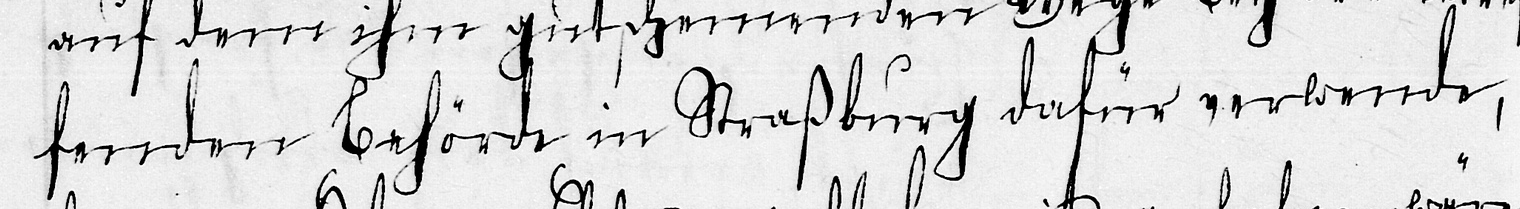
fenden Behörde in Straßburg dafür verwende,
